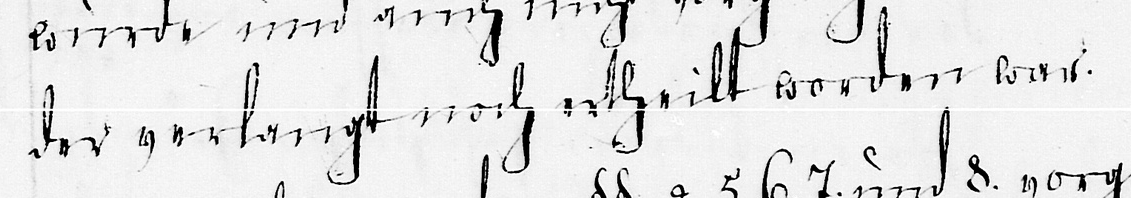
der verlangt noch ertheilt worden war.
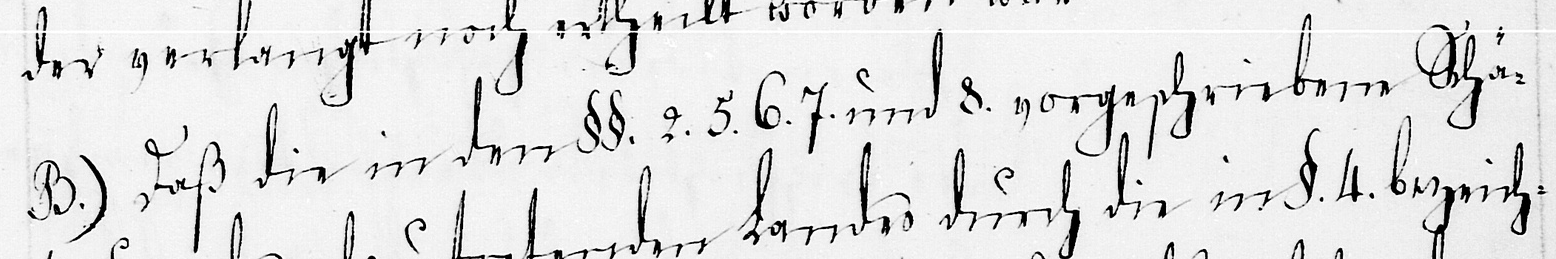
B.) Daß die in den §§. 2. 5. 6. 7. und 8. vorgeschriebene Schä¬
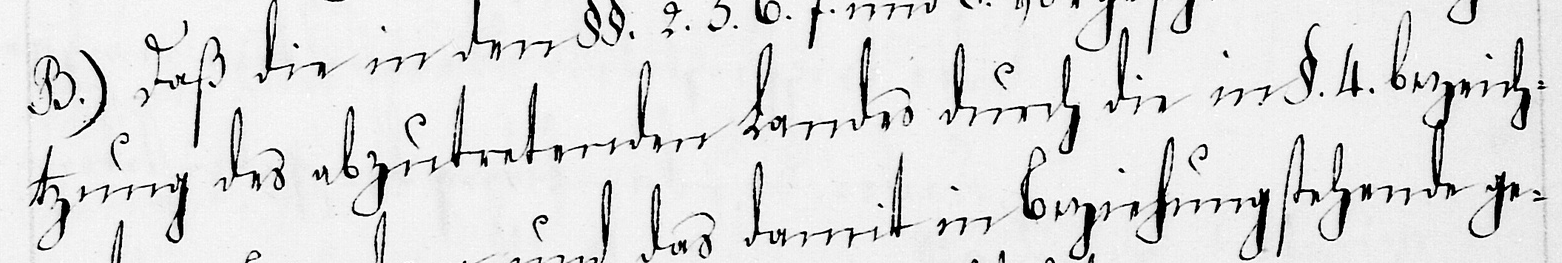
tzung des abzutretenden Landes durch die in §. 4. bezeic¬
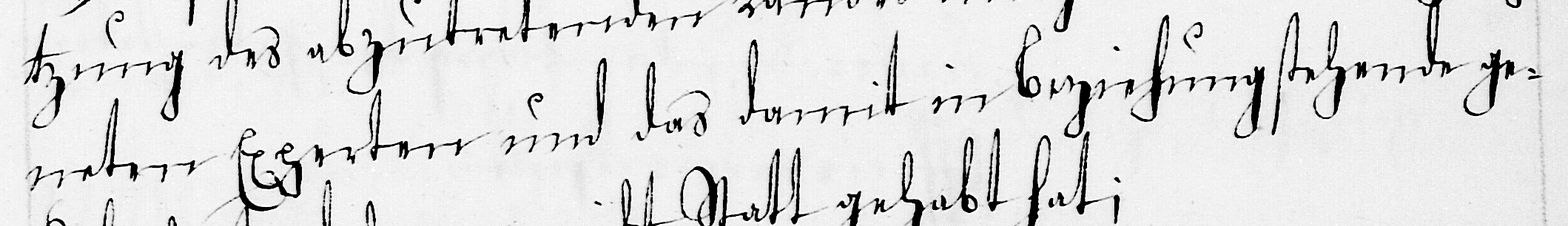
hneten Experten und das damit in Beziehung stehende ge¬
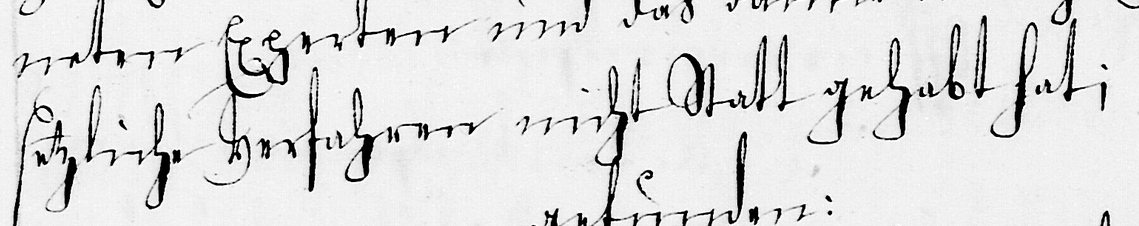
setzliche Verfahren nicht Statt gehabt hat;
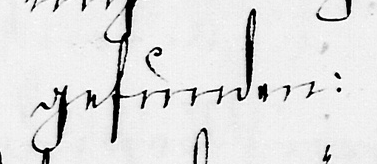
gefunden:
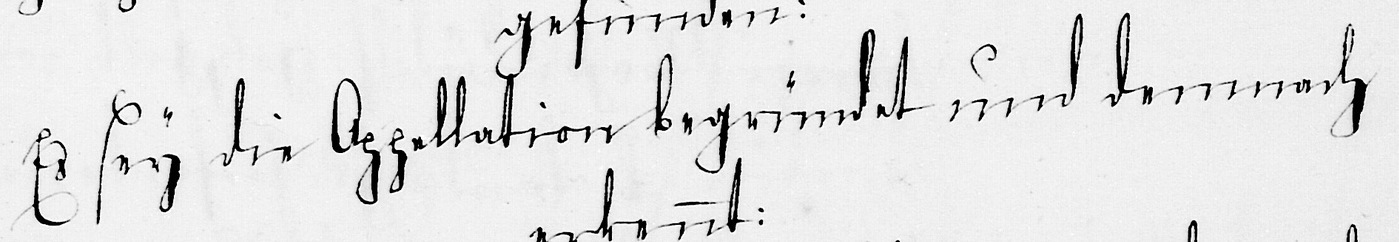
Es sey die Appellation begründet und demnach
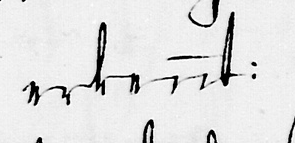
erkennt:
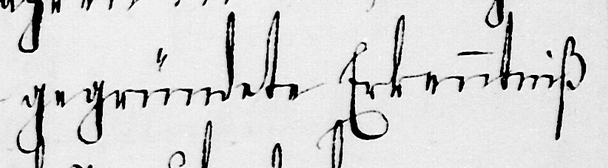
gegründete Erkenntniß
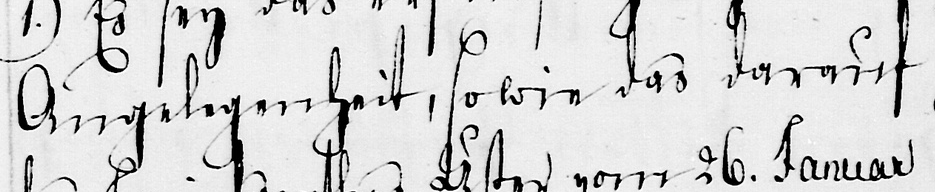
Angelegenheit, sowie das darauf
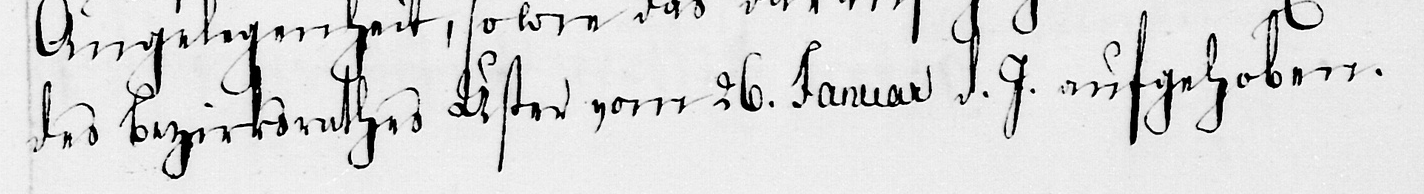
des Bezirksrathes Uster vom 26. Januar d. J. aufgehoben.
